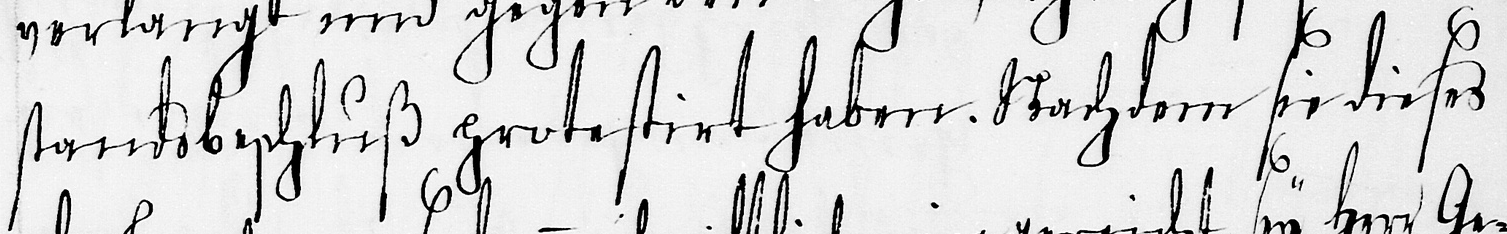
standsbeschluß protestirt haben. Nachdem sie dieses
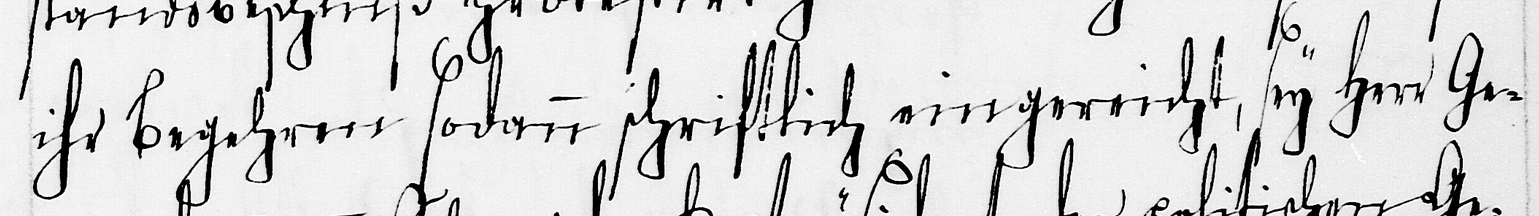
ihr Begehren sodann schriftlich eingereicht, sey Herr Ge¬
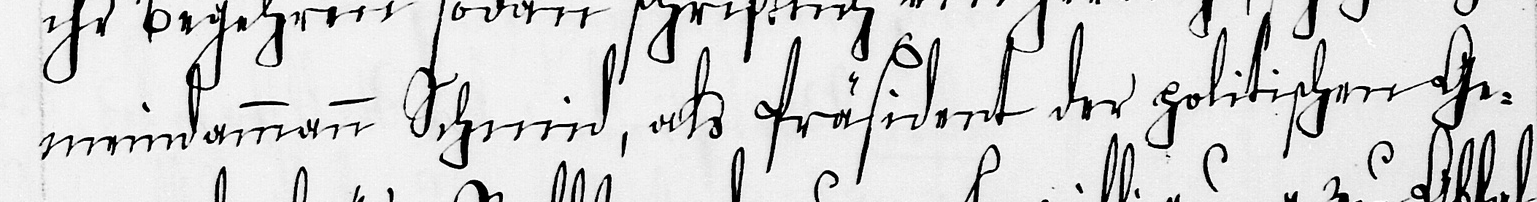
meindammann Schmid, als Präsident der politischen Ge¬
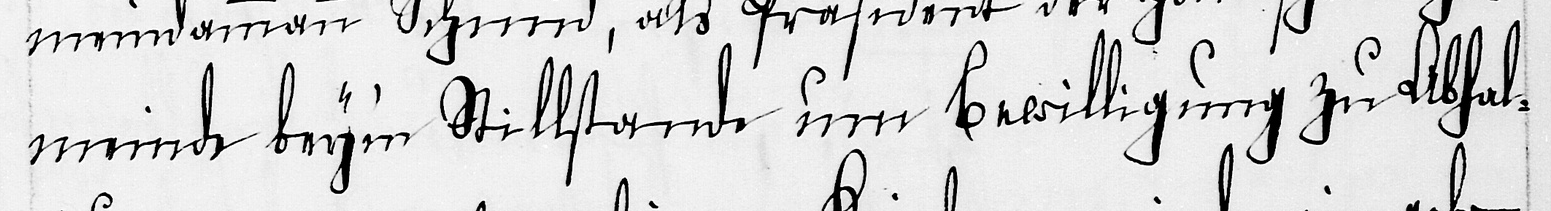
meinde bey’m Stillstande um Bewilligung zu Abhal¬
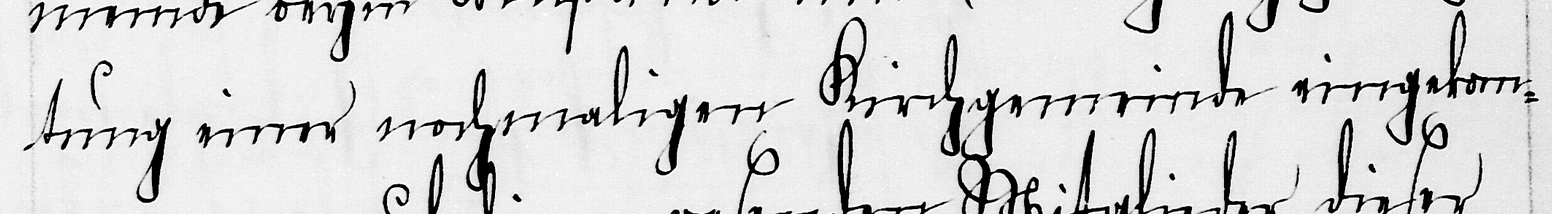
tung einer nochmaligen Kirchgemeinde eingekom¬
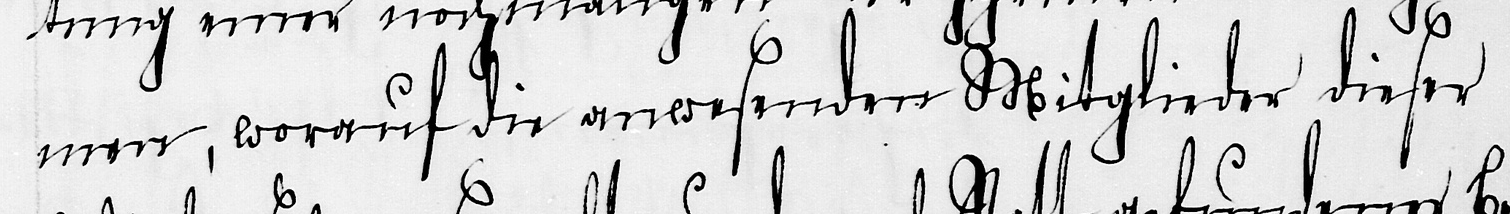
men, worauf die anwesenden Mitglieder dieser
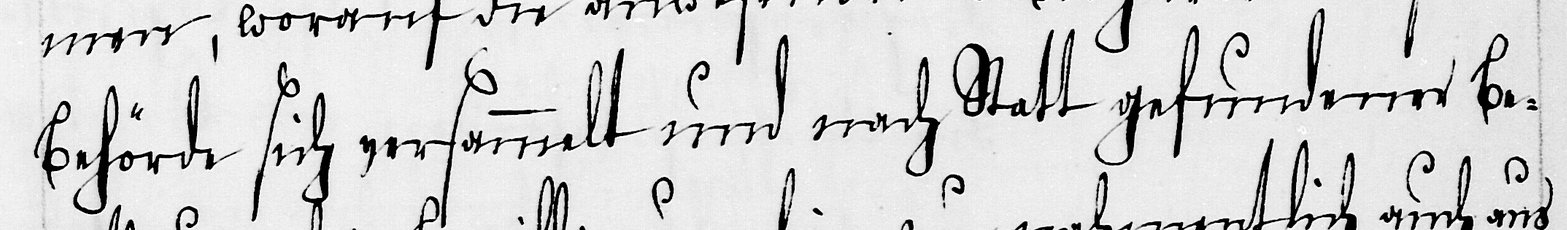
Behörde sich versammelt und nach Statt gefundener Be¬
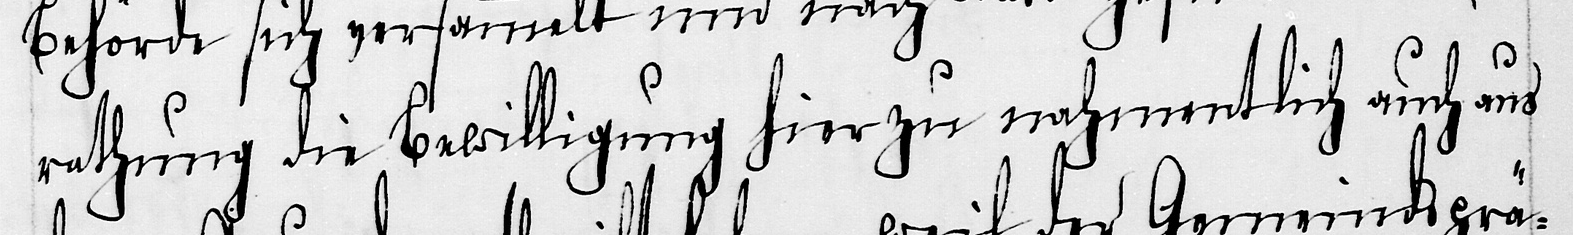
rathung die Bewilligung hierzu nahmentlich auch aus
